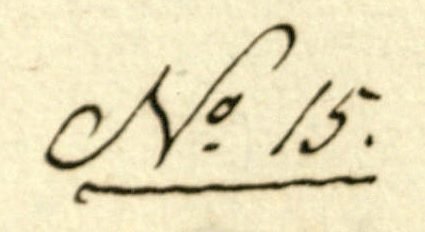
No 15.
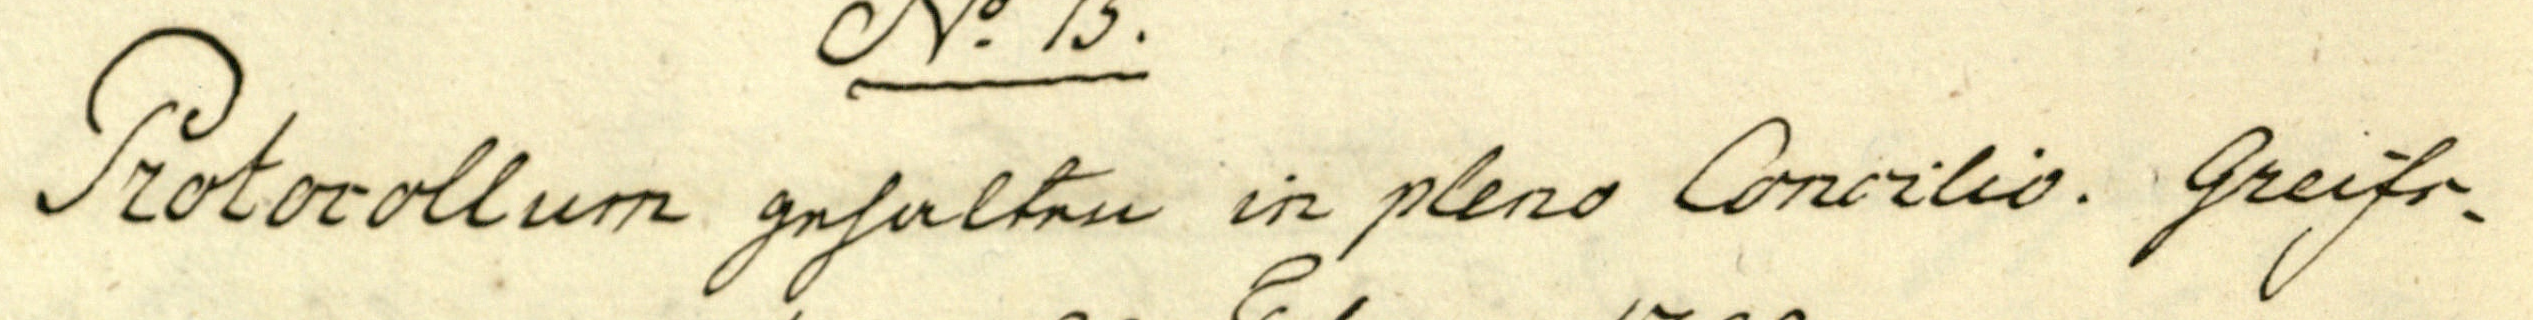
Protocollum gehalten in pleno Concilio. Greifs¬
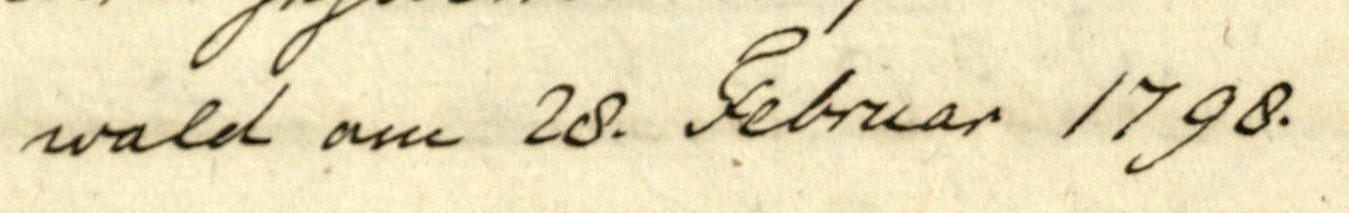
wald am 28. Februar 1798.
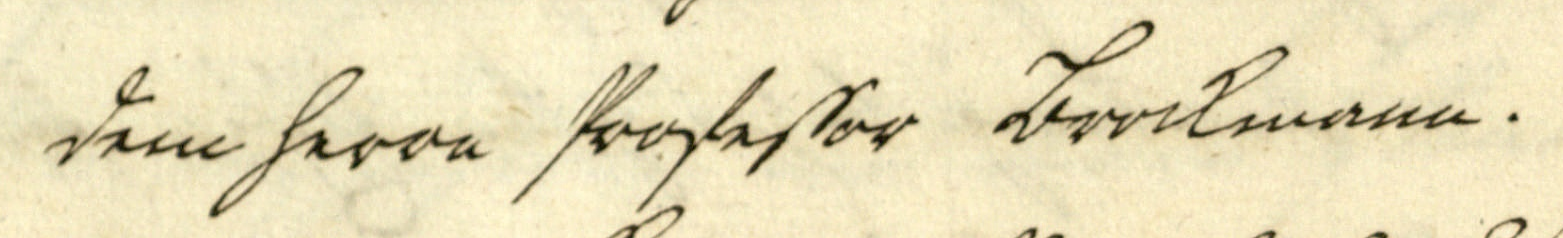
dem Herrn Professor Brockmann.
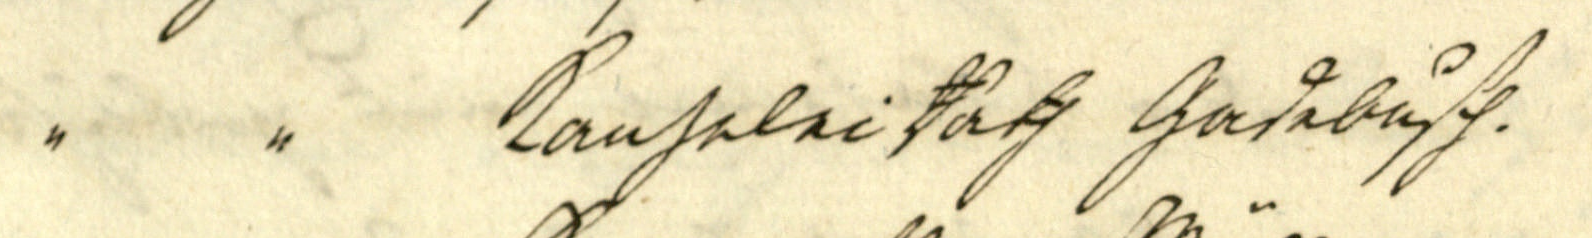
Kanzelei Rath Gadebusch.
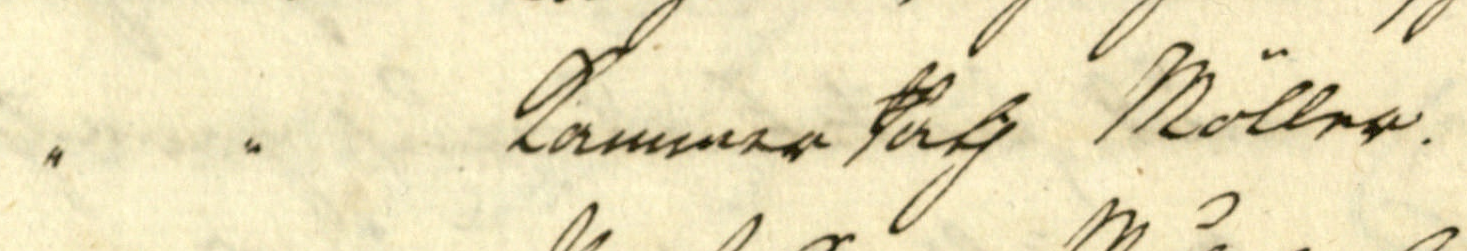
Kammer Rath Möller.
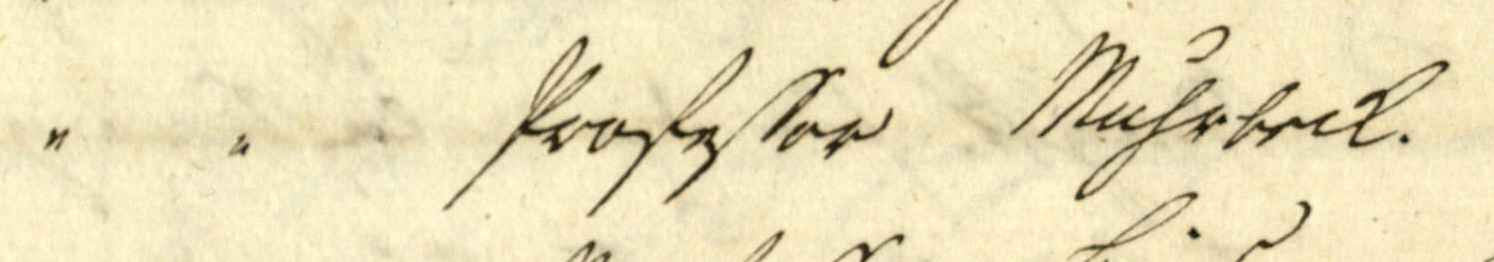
Professor Muhrbeck.
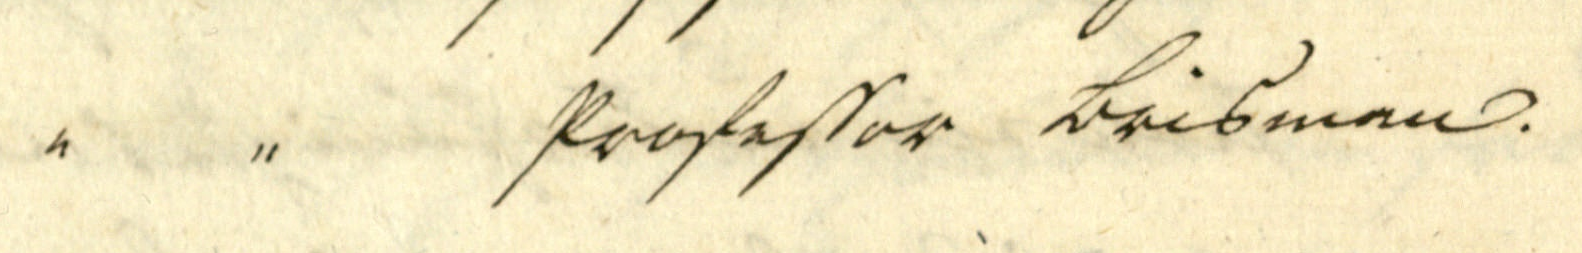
Professor Brisman.
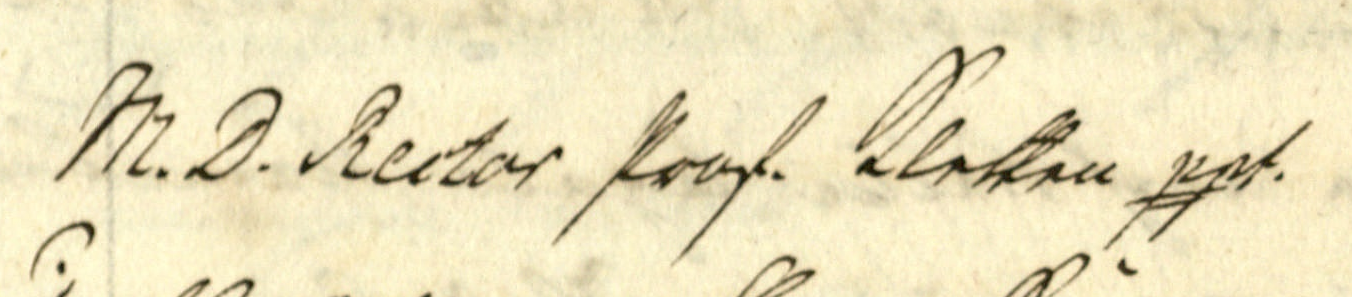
M. D. Rector Prof. Kletten ppt.
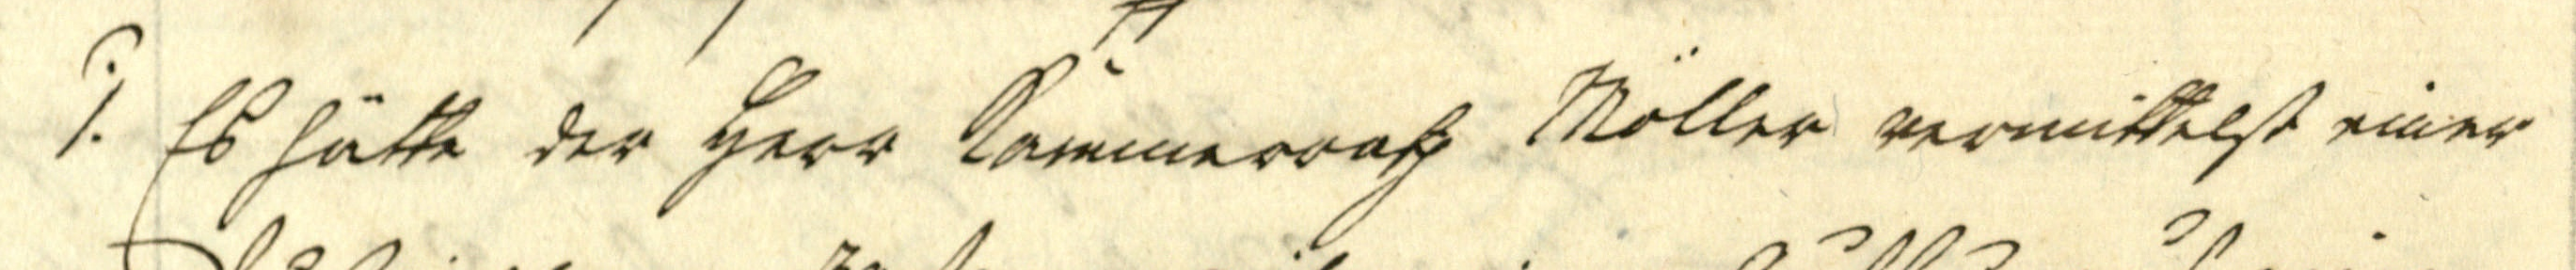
1. Es hätte der Herr Kammerrath Möller vermittelst einer
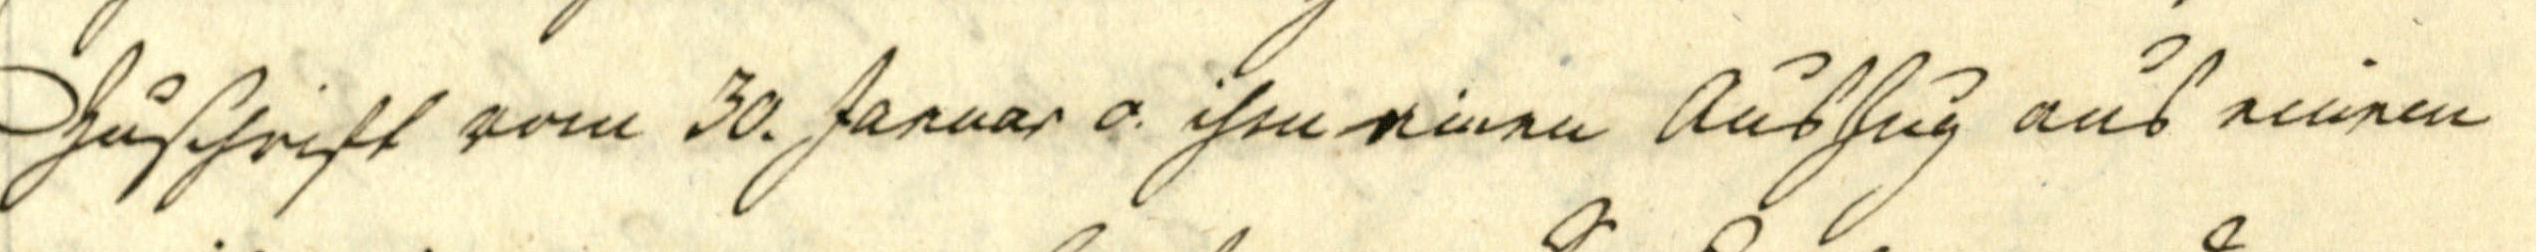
Zuschrift vom 30. Januar o ihm einen Auszug aus einem
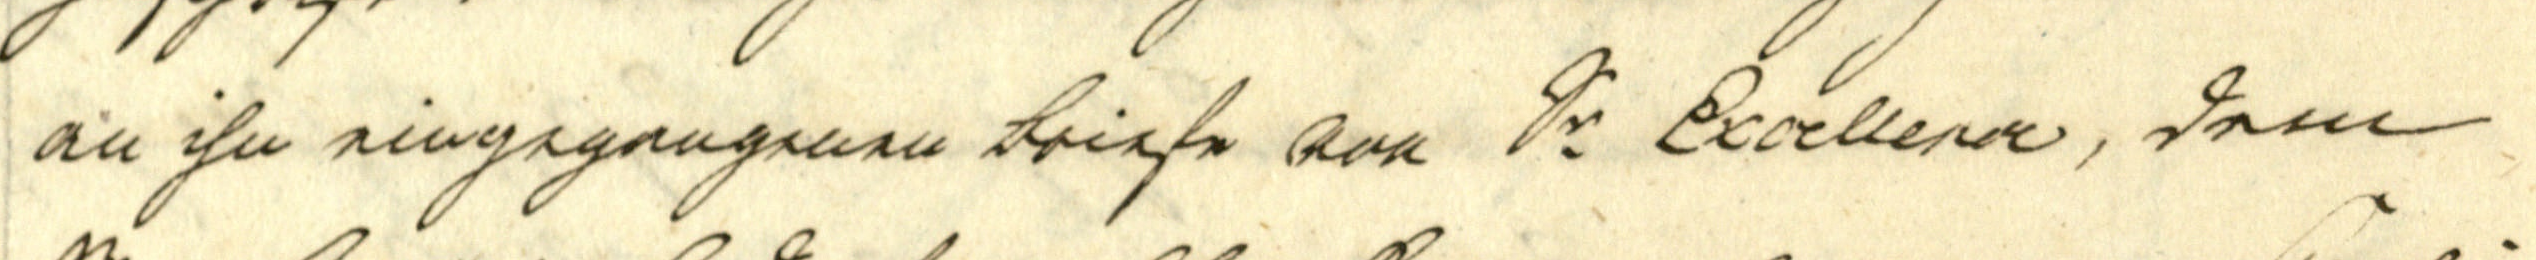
an ihn eingegangenen Briefe von Sr Excellence, dem
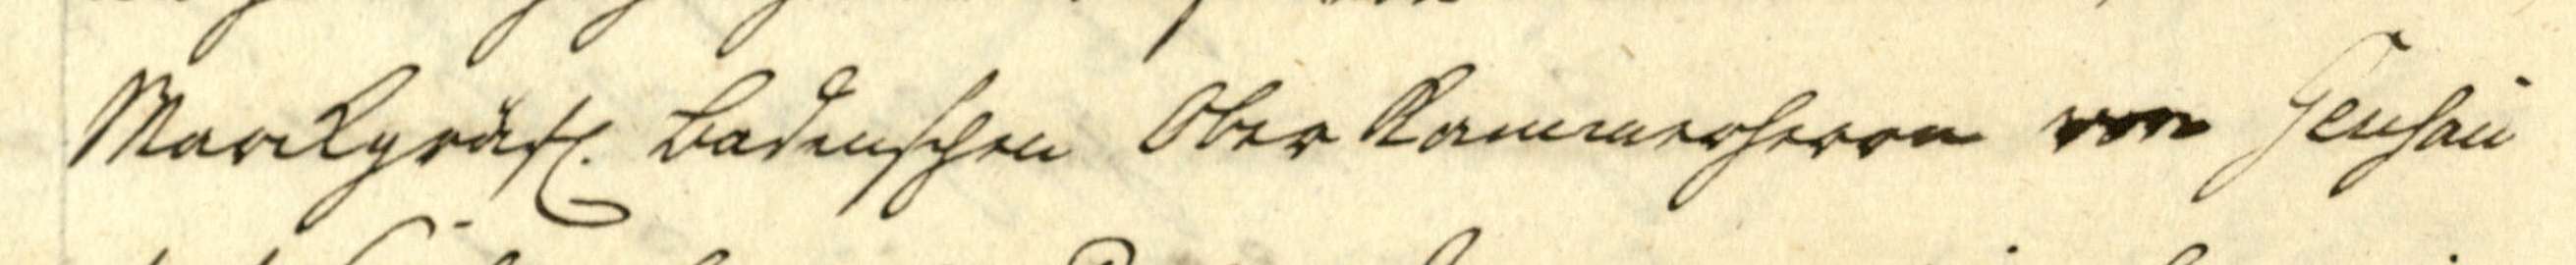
Marckgräfl. Badenschen Oberkammerherrn von Genhau
